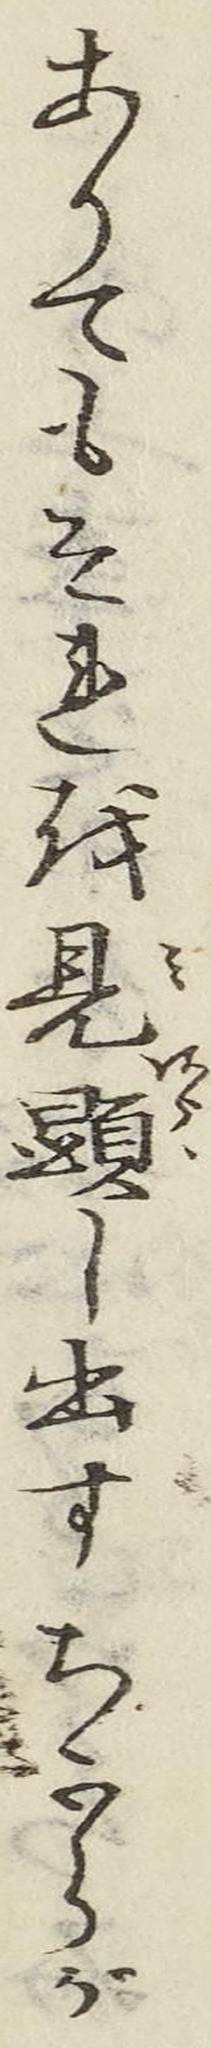ありてもそれを見顕し出すちからが
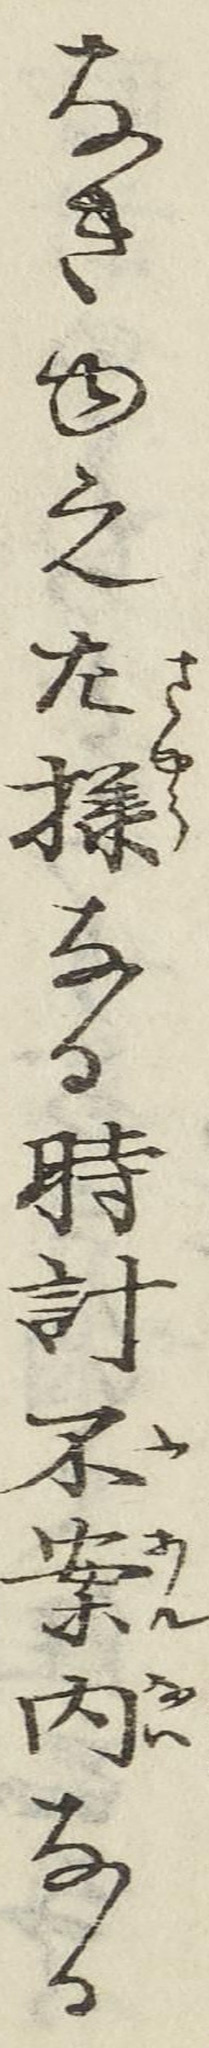なきゆえ左様なる時計不案内なる
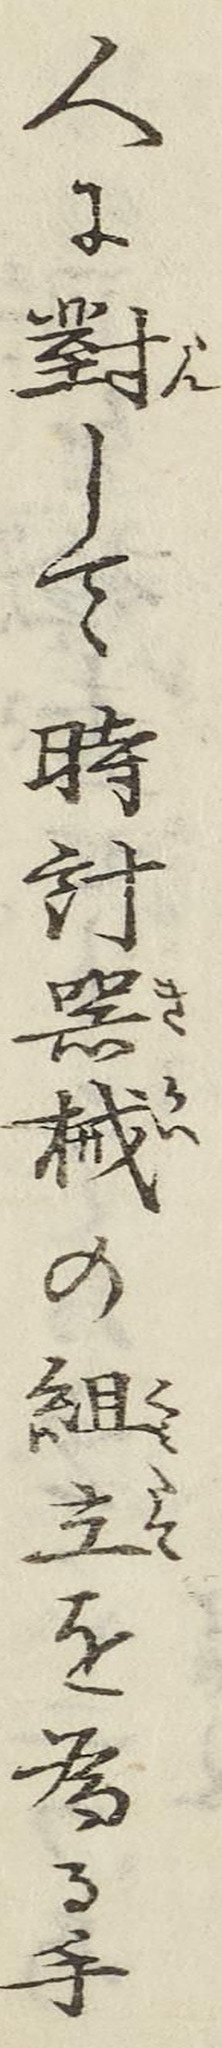人に対して時計器械の組立を為る手
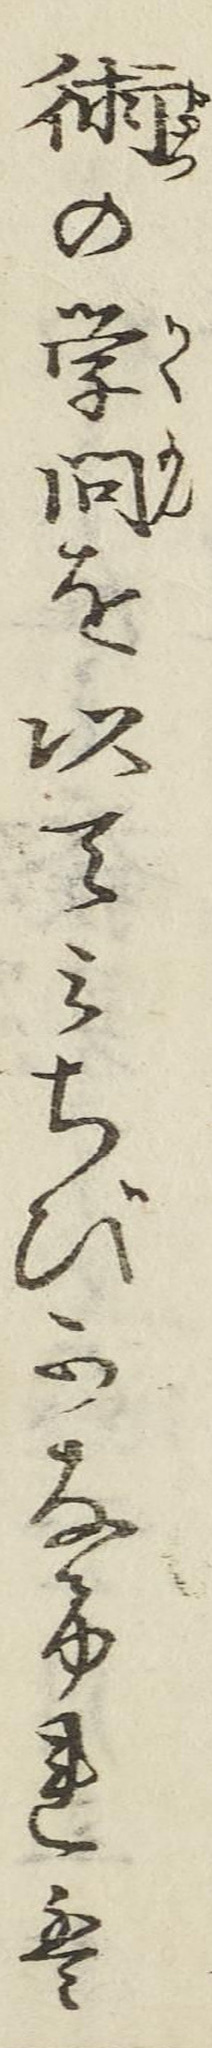術の学問を以てみちびかなけれは
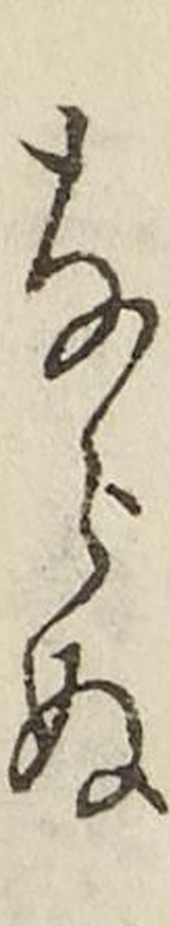ならぬ

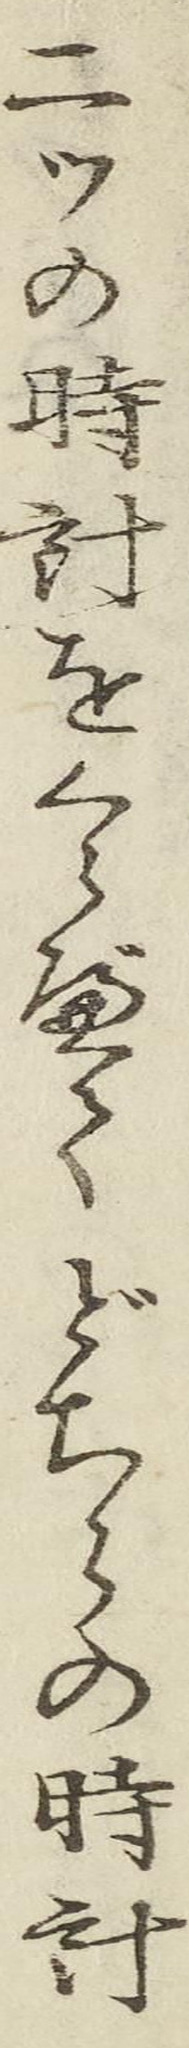二ツの時計をくらべてどちらの時計
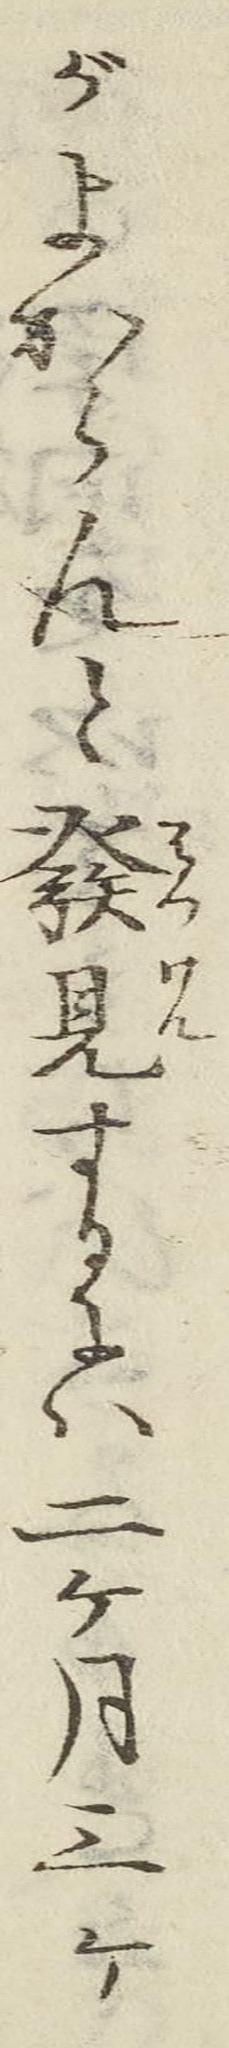がよからんと発見するには二ヶ月三ヶ
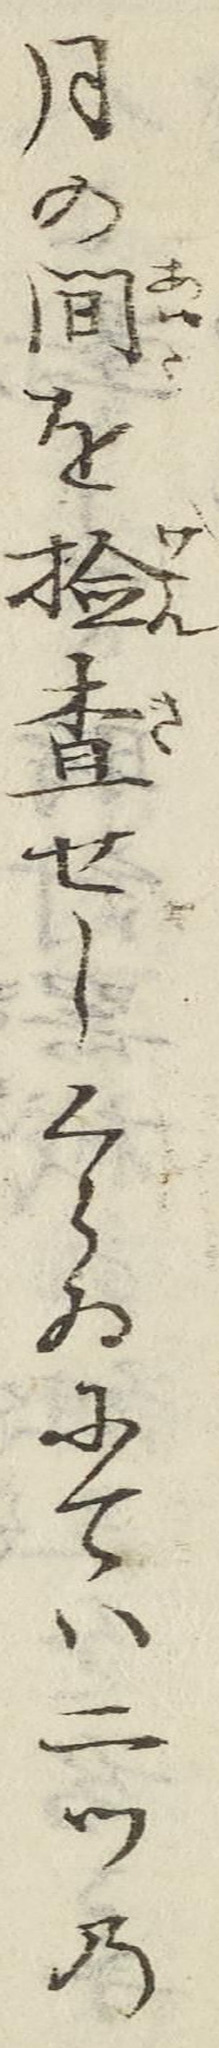月の間を検査せしくらゐにては二ツの
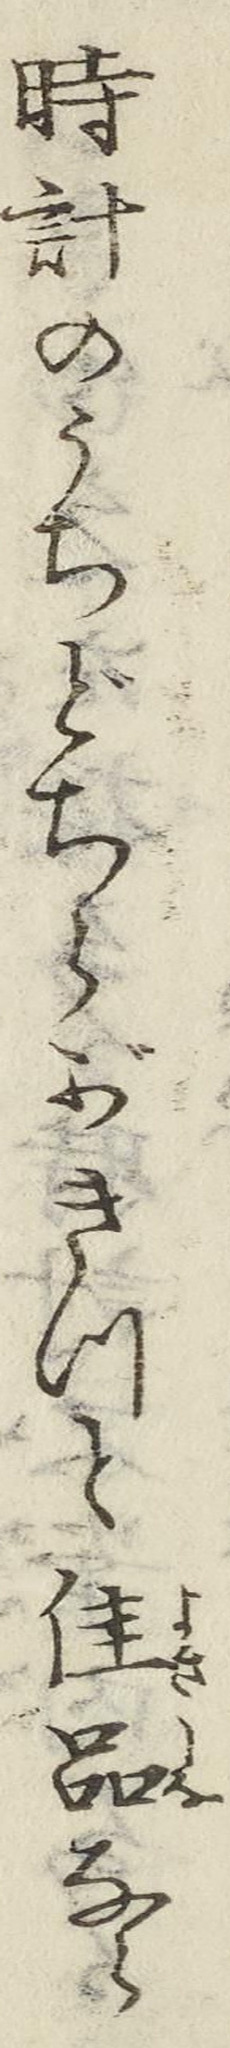時計のうちどちらがきつと佳品なら
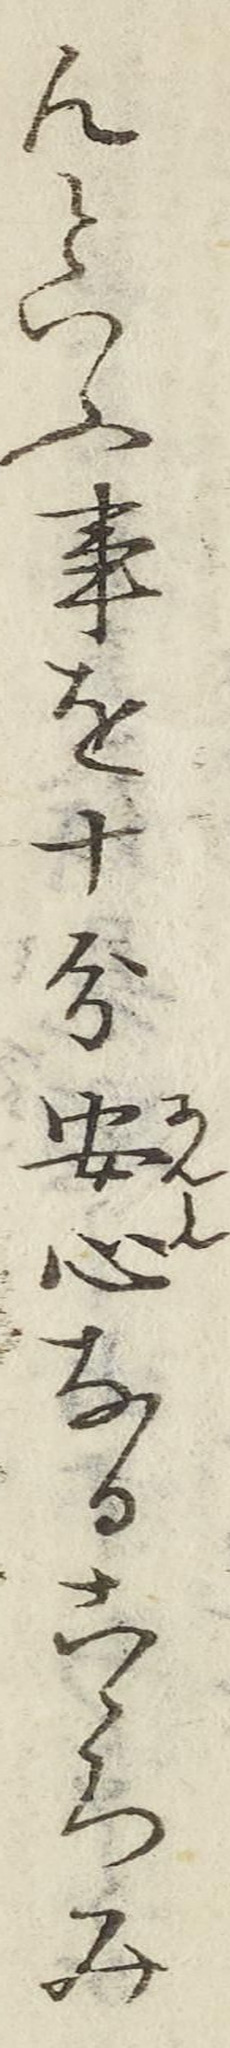んといふ事を十分安心なるこゝろみ
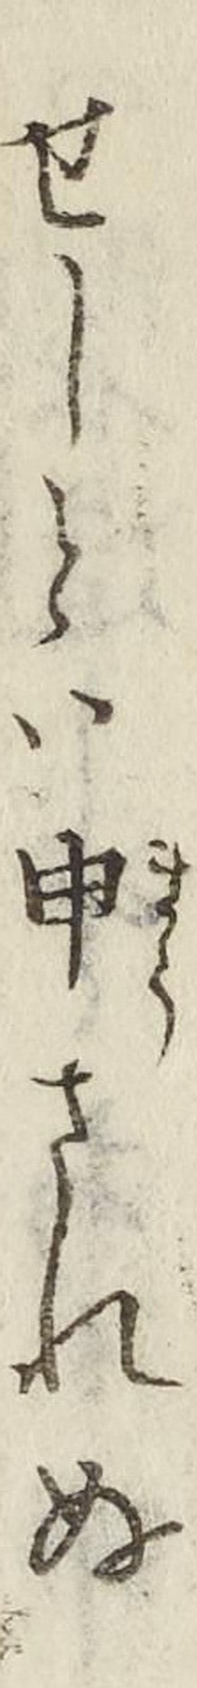せしとは申されぬ
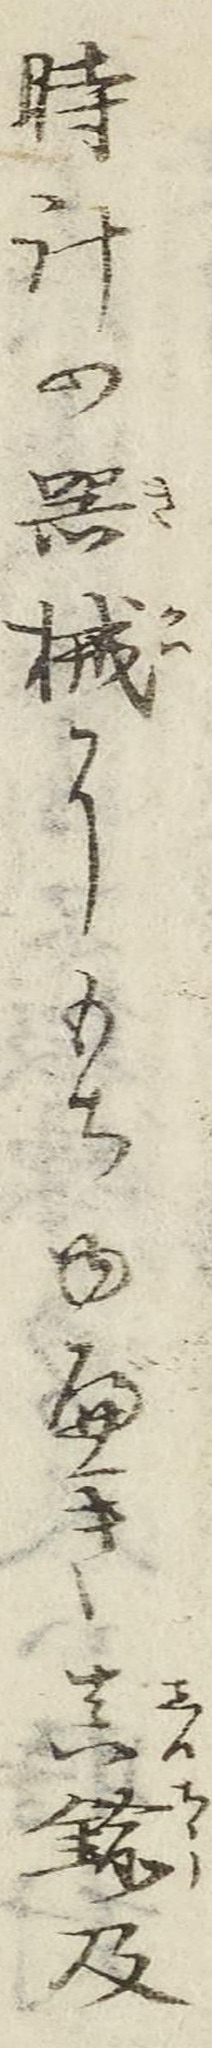時計の器械にもちゆべき真鍮及
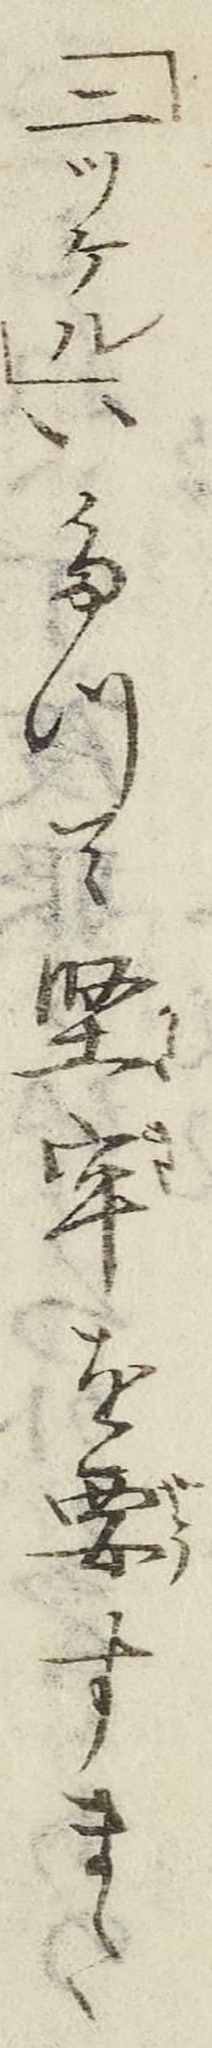「ニツケル」はたつて堅牢を要すまた
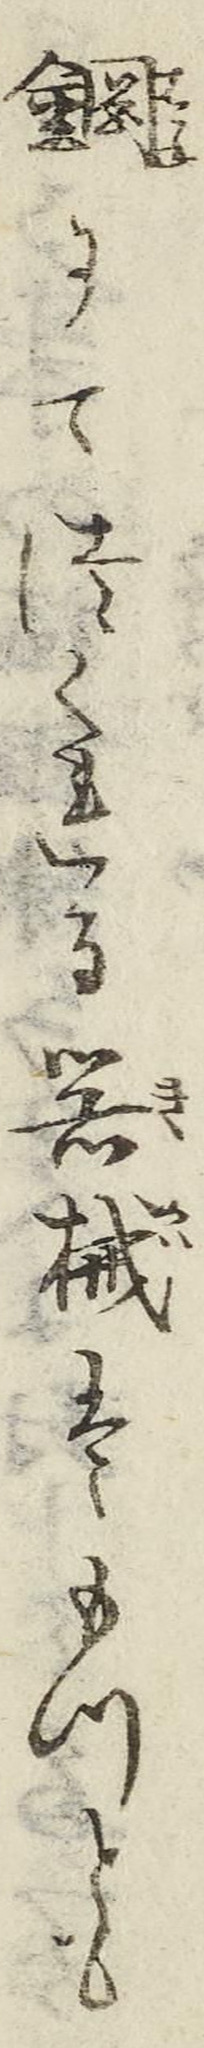鋼にてつくれる器械はもつとも
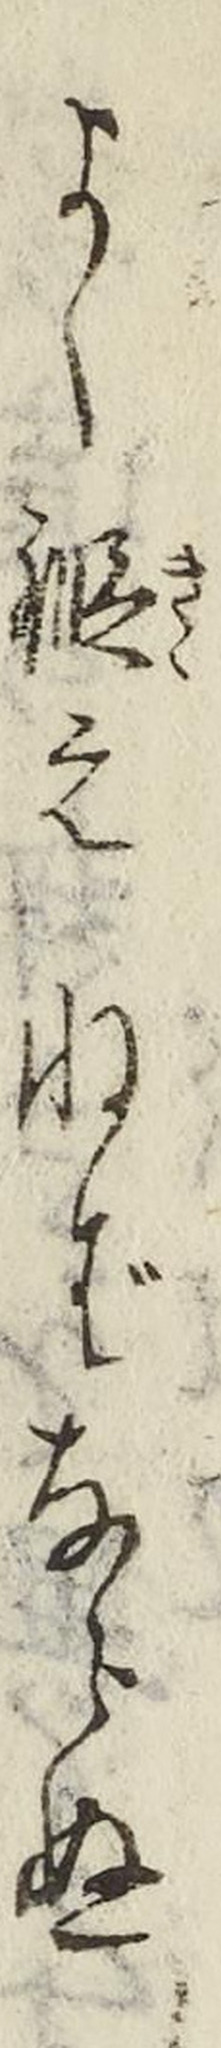よく鍛えねばならぬ
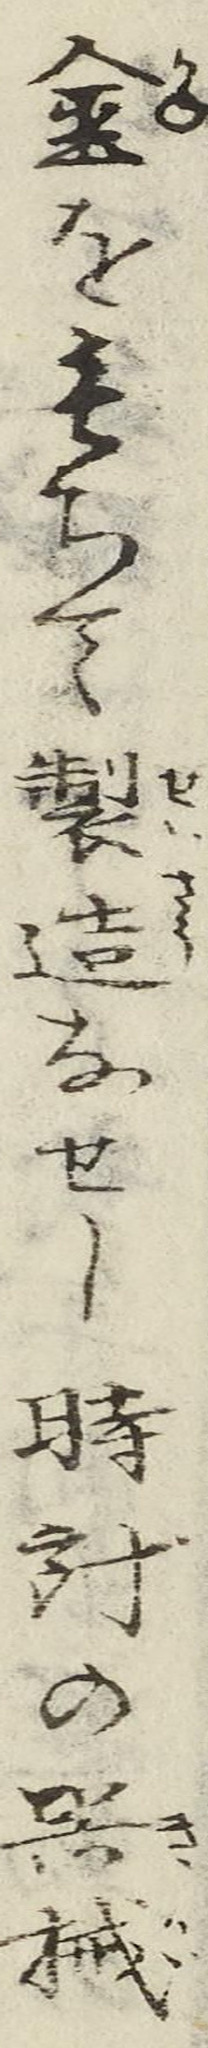金をもちて製造なせし時計の器械
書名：[時計に関する冊子]
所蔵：東京大学地震研究所図書室 Earthquake Research Institute Library, The University of Tokyo, JAPAN
